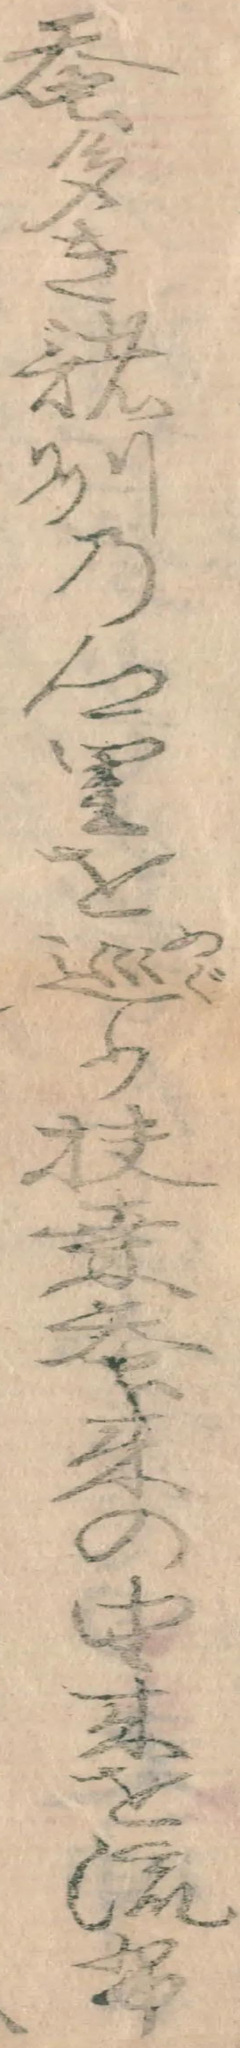蚕多き諸州の郷里を巡り扶桑蚕来の由来を流布
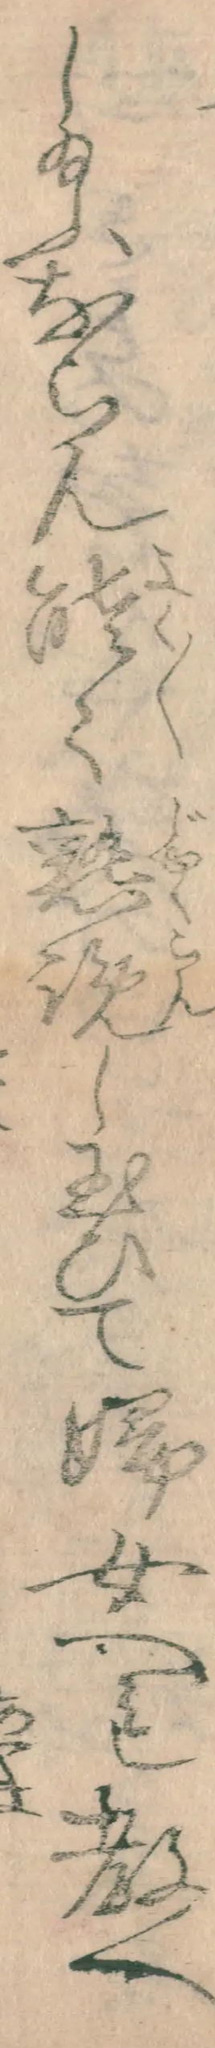し給ふならん能々熟覧し玉ひて婦女へも教へ
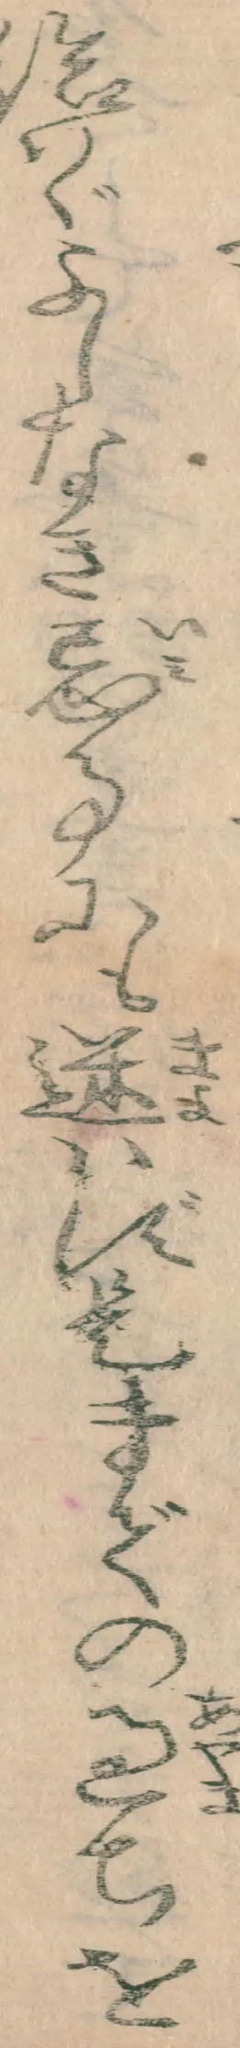給はゞよしなき忌事にも迷はず是までの過ちを
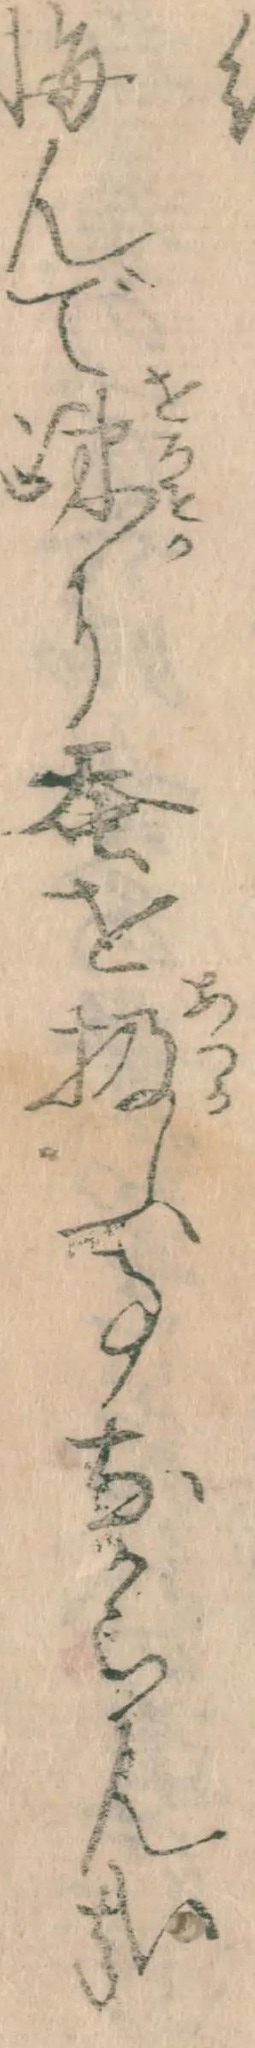悔んで疎に蚕を扱ふ事なからん哉
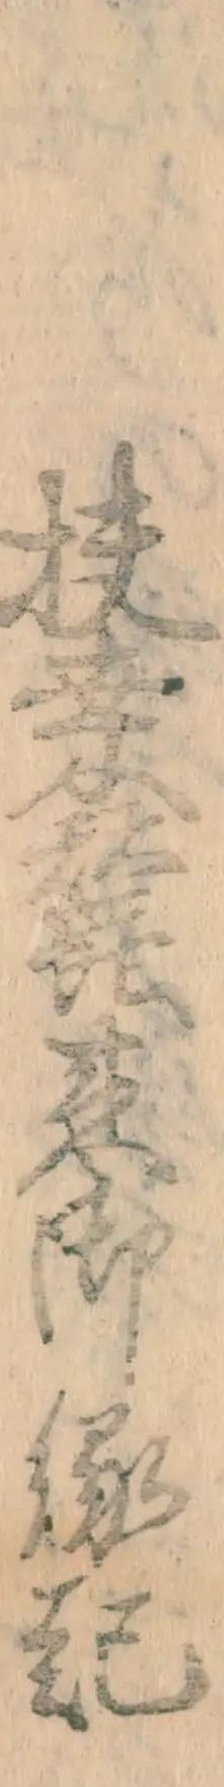扶桑蚕来御縁起
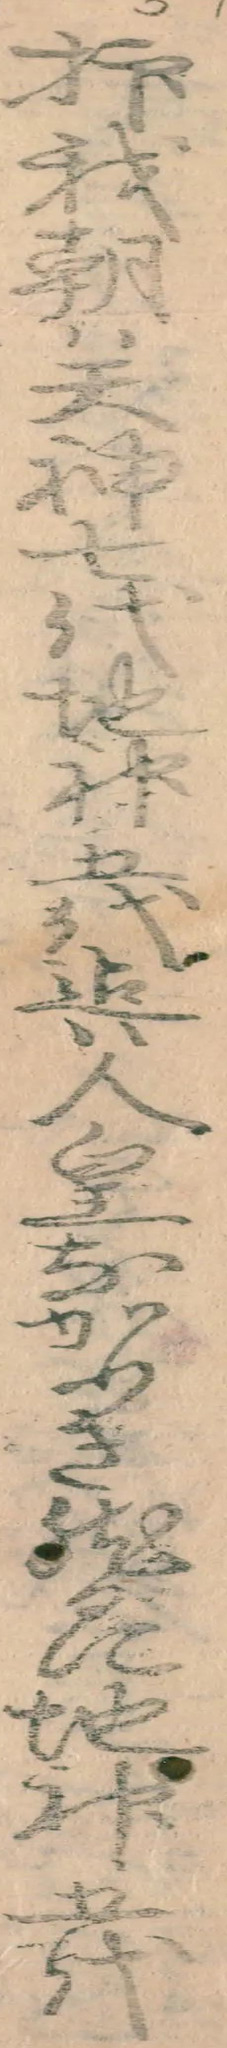抑我朝は天神七代地神五代迄は人皇なかりき然るに地神五代
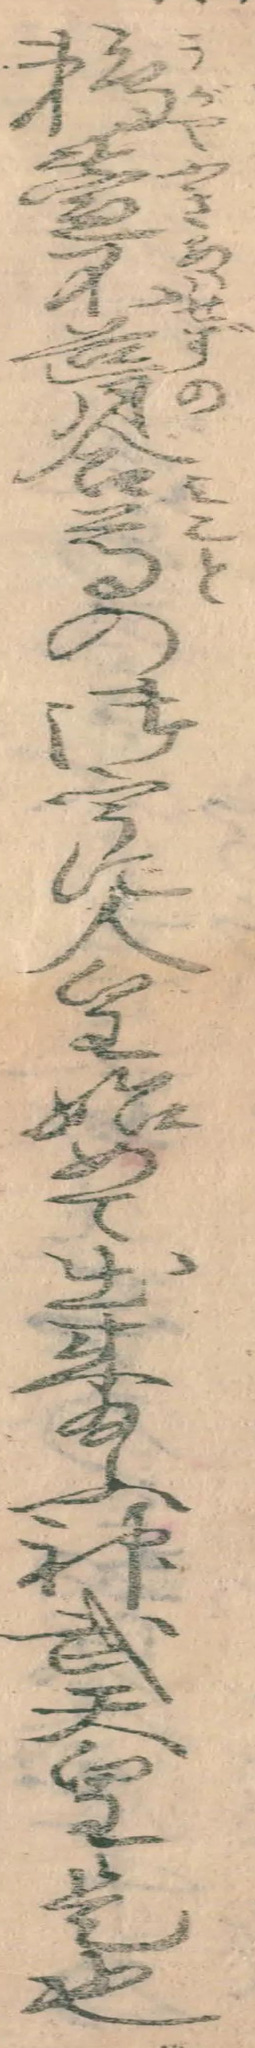鵜萱不葺合尊の御宇に人皇始めて出来給ふ神武天皇是也
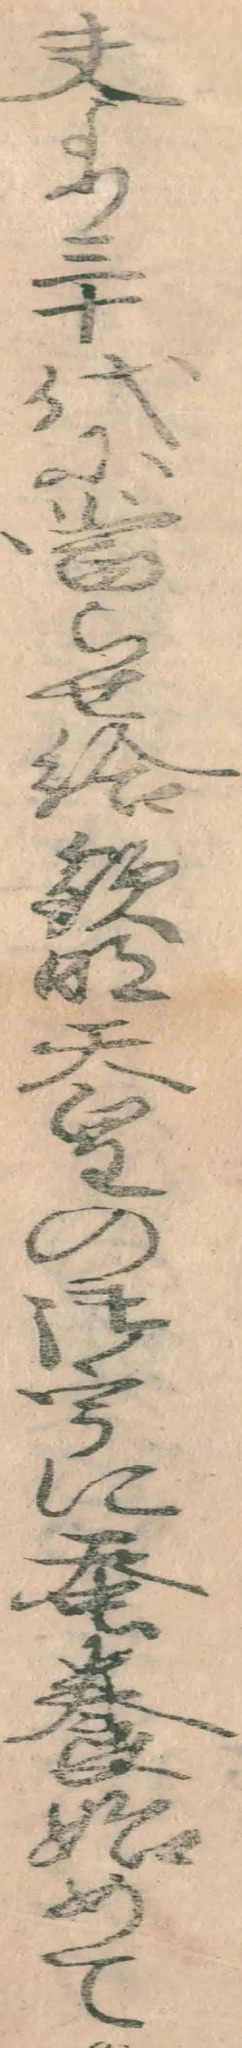夫より三十代に当らせ給欽明天皇の御宇に蚕養始めて
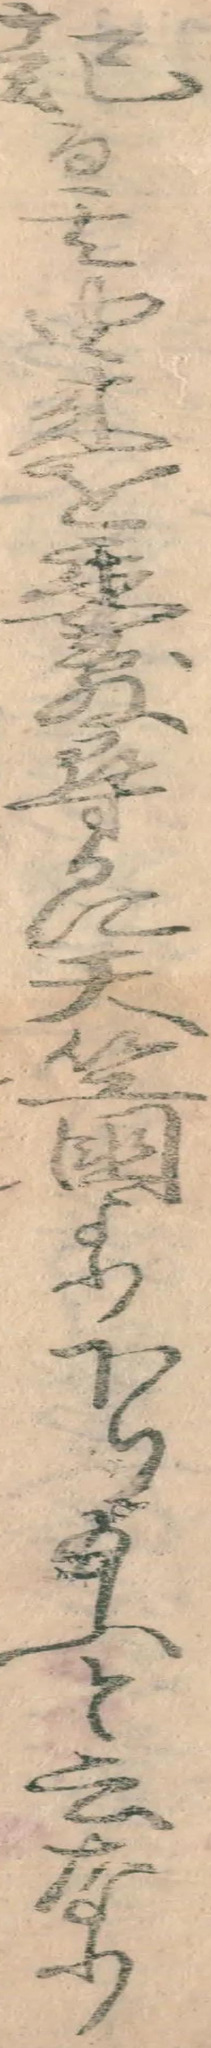起る其由来を委敷尋るに天竺国より下り給ふと云なり
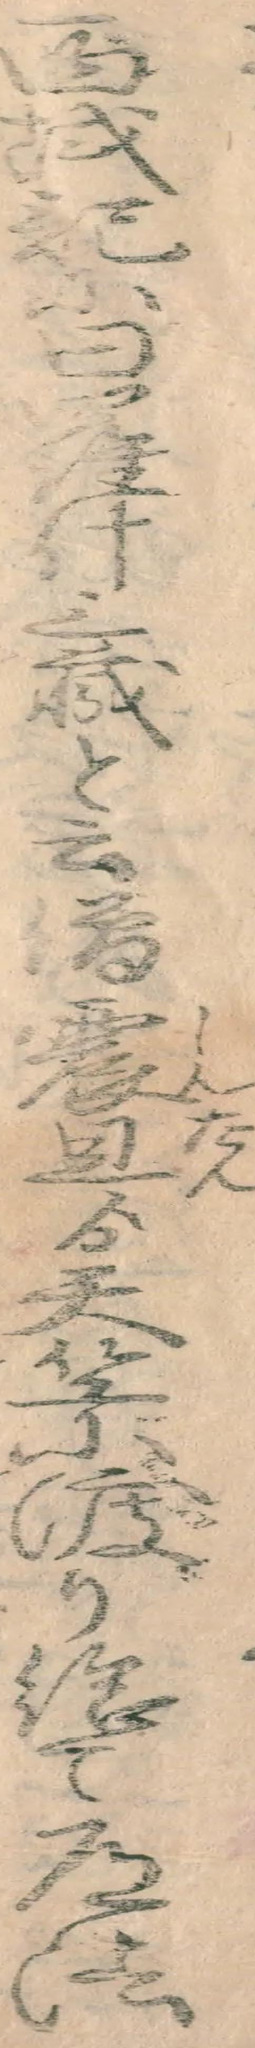西域記に曰羅什三蔵と云僧震旦ゟ天竺に渡り給て道法
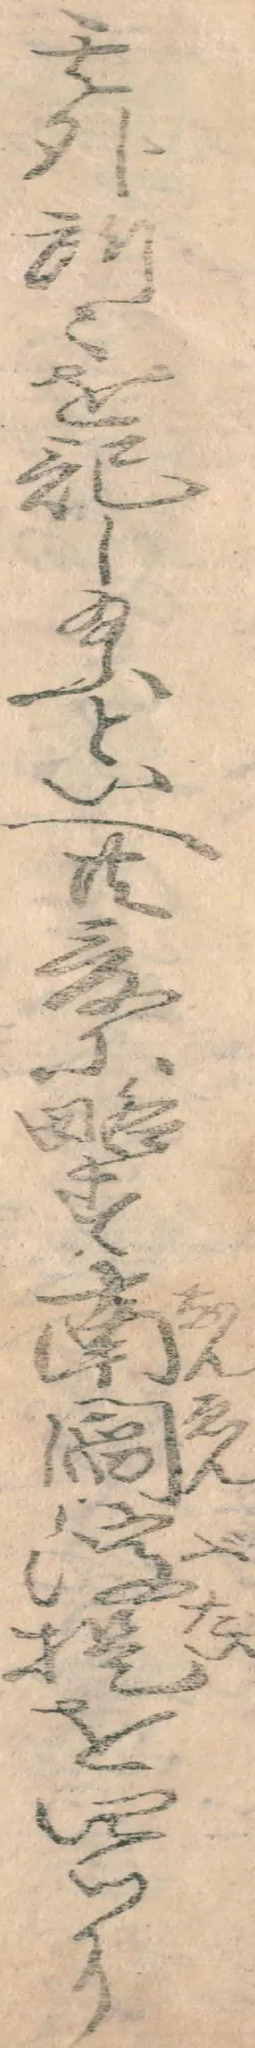其外所々を記し給ふといへ共爰に略す南閻浮提を四ッに
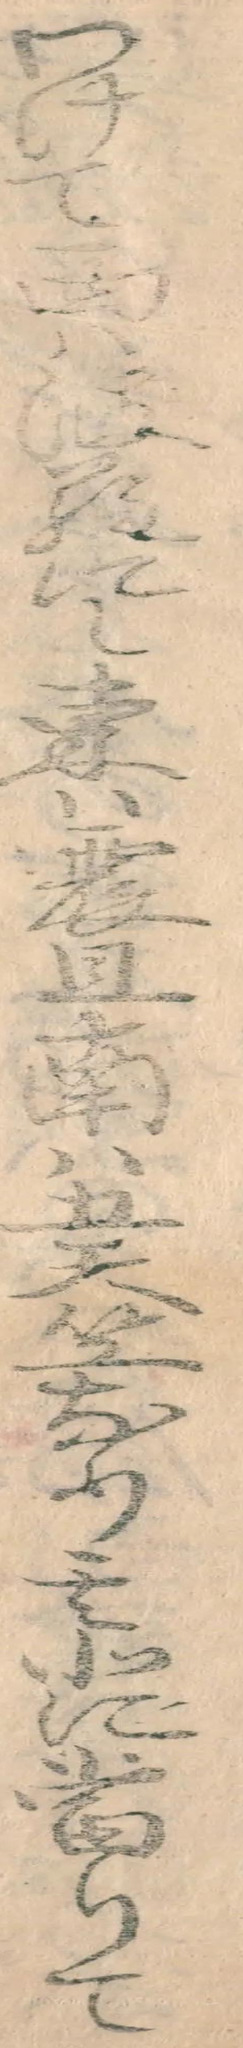わけて西は波羅にし東は震旦南は五天竺なり其北に当りて
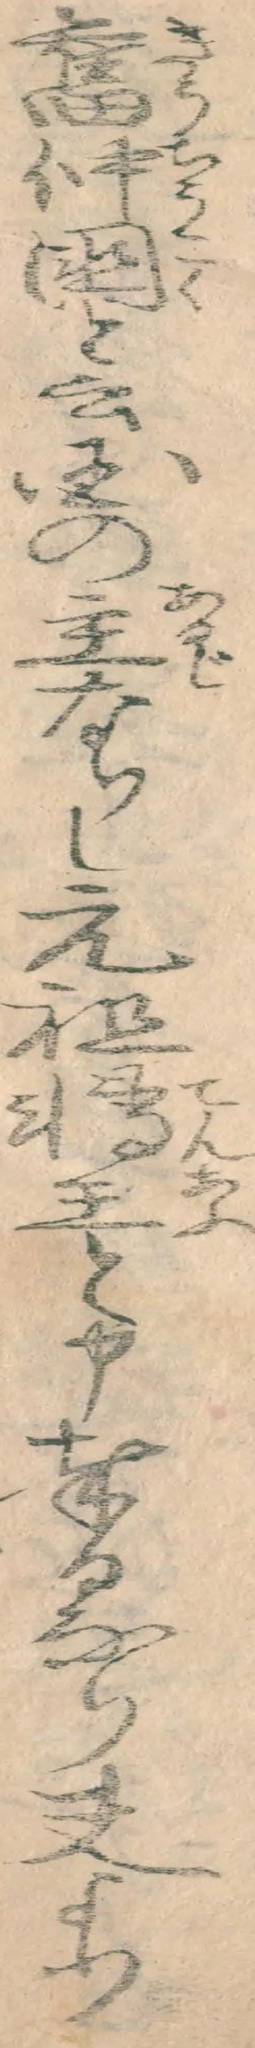旧仲国と云国の主なりし元祖転王と申奉るなり夫より
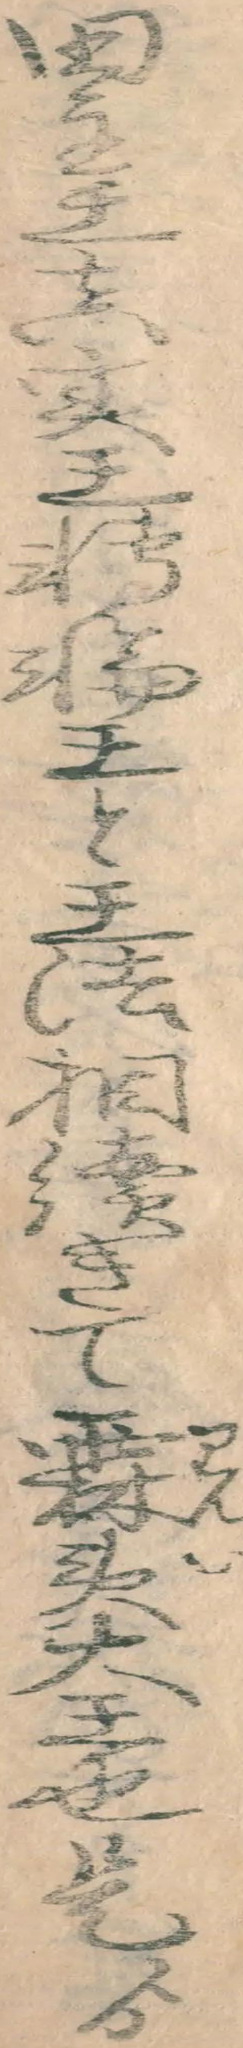田主王真実王転輪王と王法相続きて霖夷大王也是ゟ

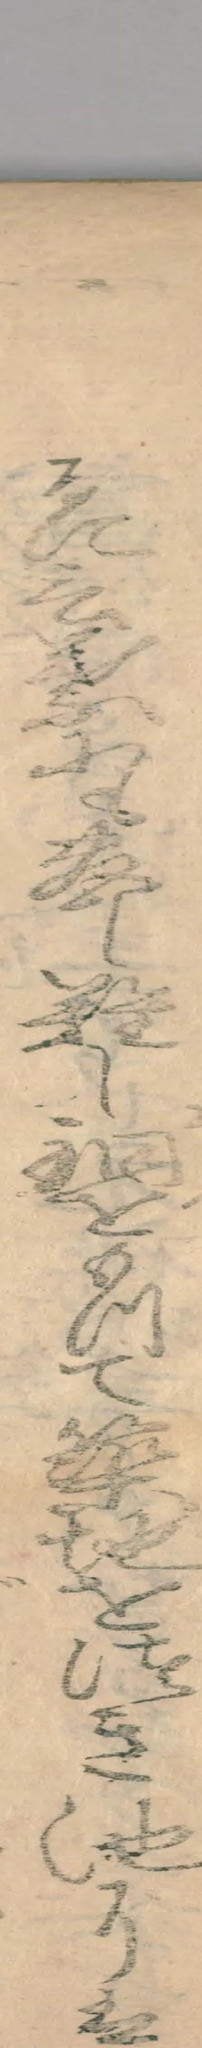るに言葉にも尽し難し銅をもつて築地をつき池には
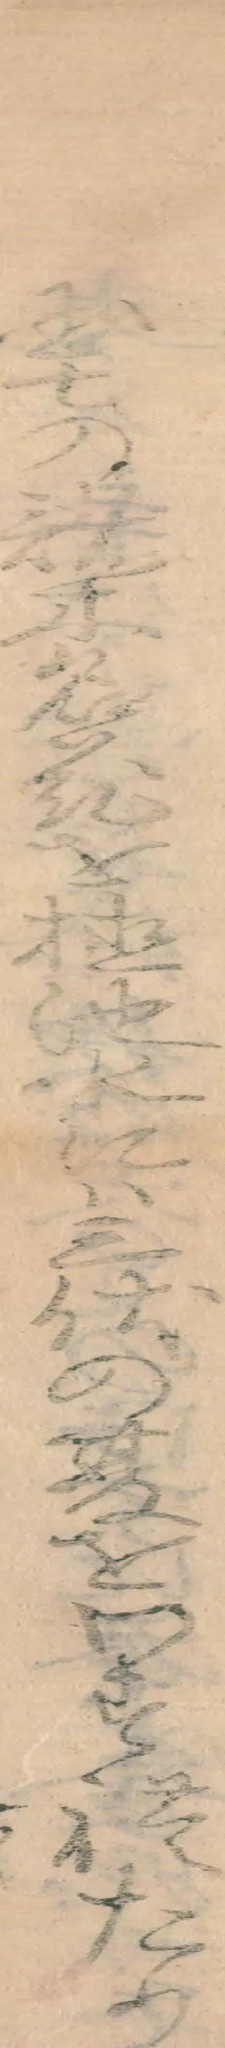国土の諸木名花を植池水には三伏の夏をわすれたり
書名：蚕養御由来記
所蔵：国立国会図書館 National Diet Library, JAPAN
